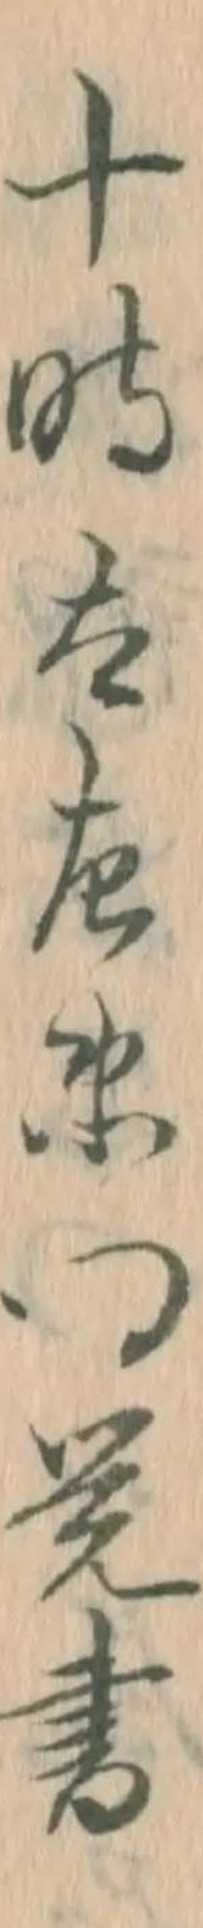十時太左衛門覚書
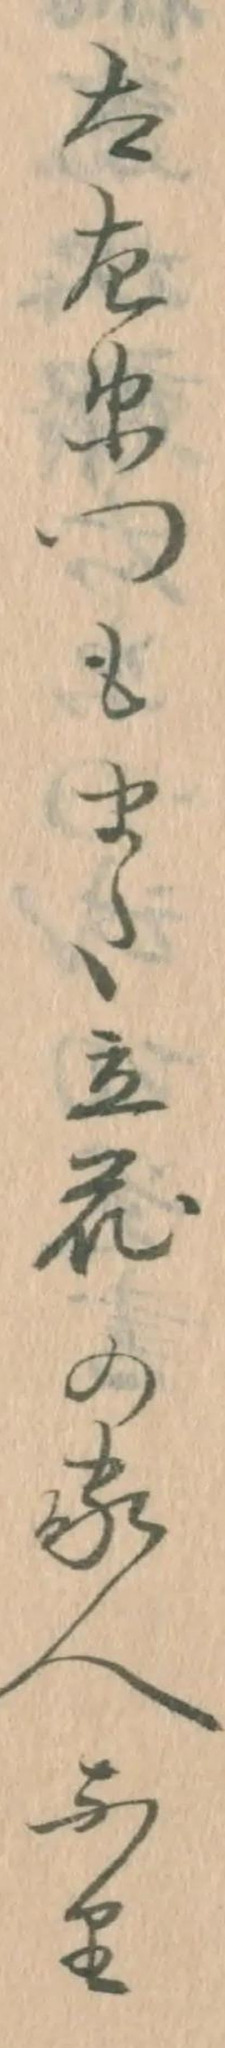太左衛門もまた立花の家人なり

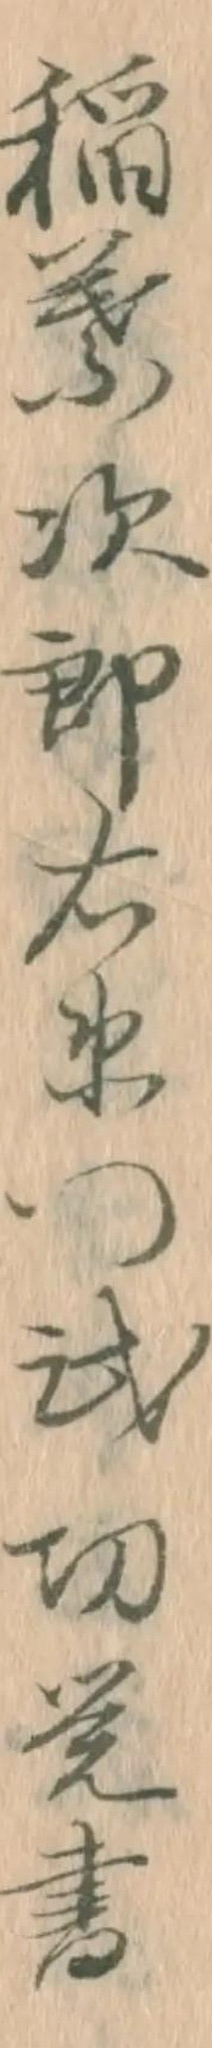稲葉次郎右衛門武功覚書
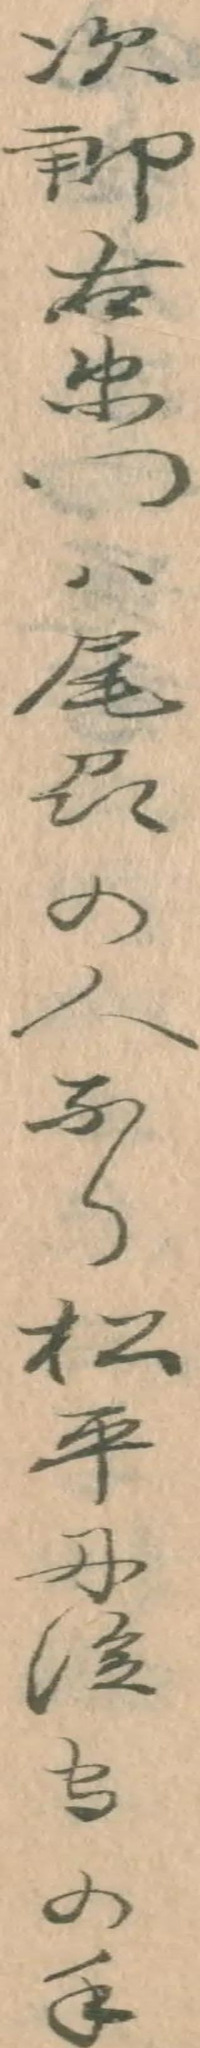次郎右衛門は尾州の人なり松平丹後守の手
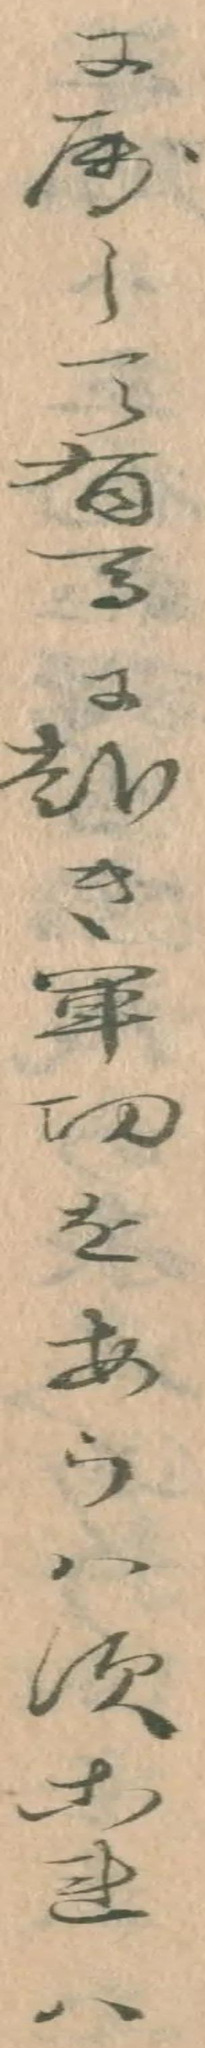に属して有馬に赴き軍功をあらはすこれは
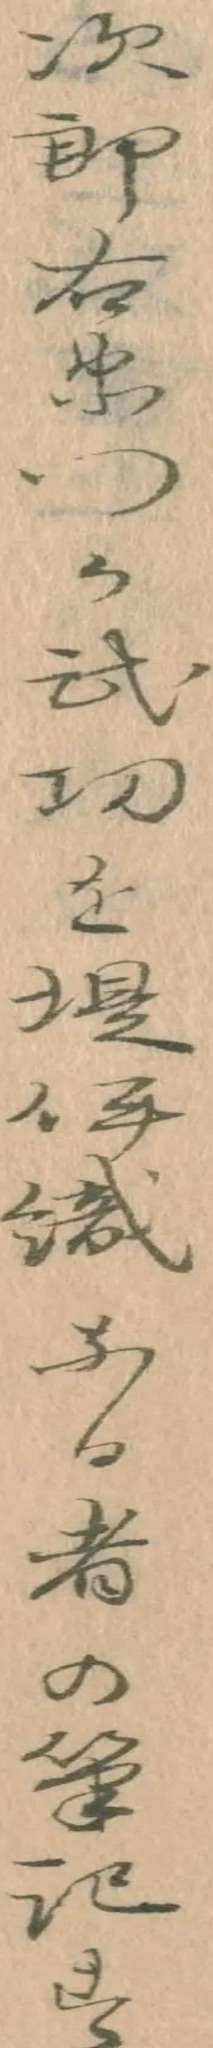次郎右衛門か武功を堤伊織なる者の筆記す
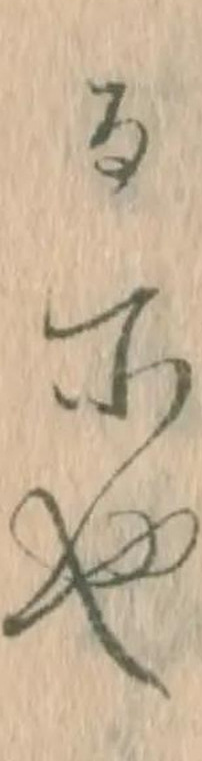る所也
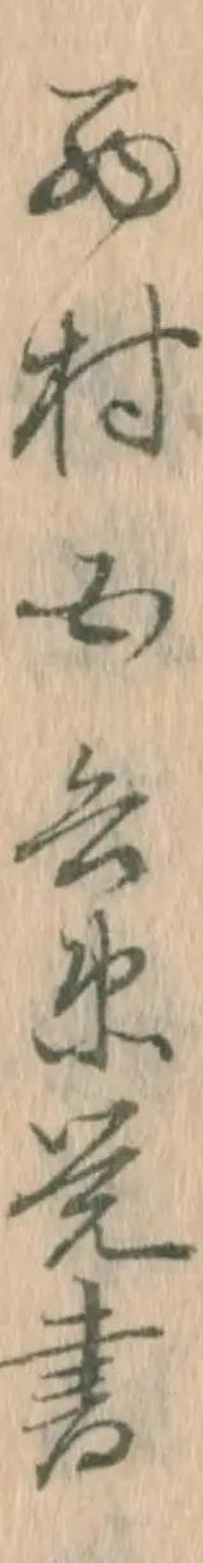西村五兵衛覚書
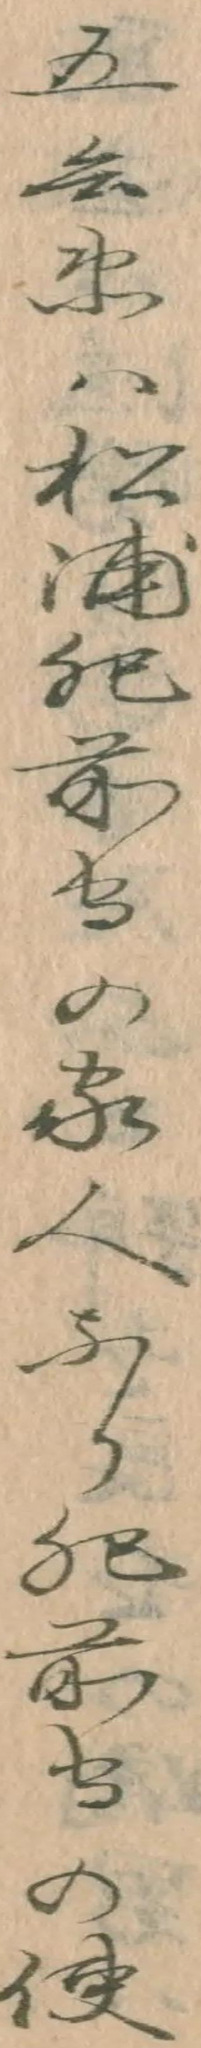五兵衛は松浦肥前守の家人なり肥前守の使
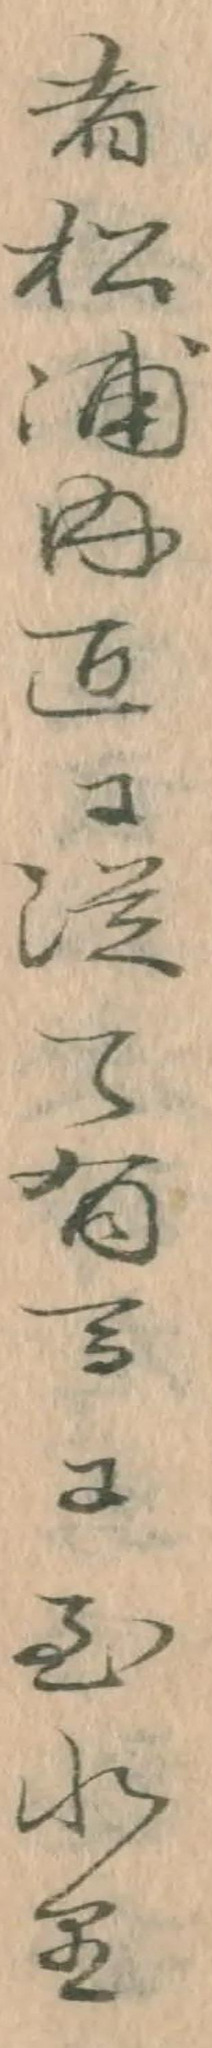者松浦内匠に従て有馬に至れり
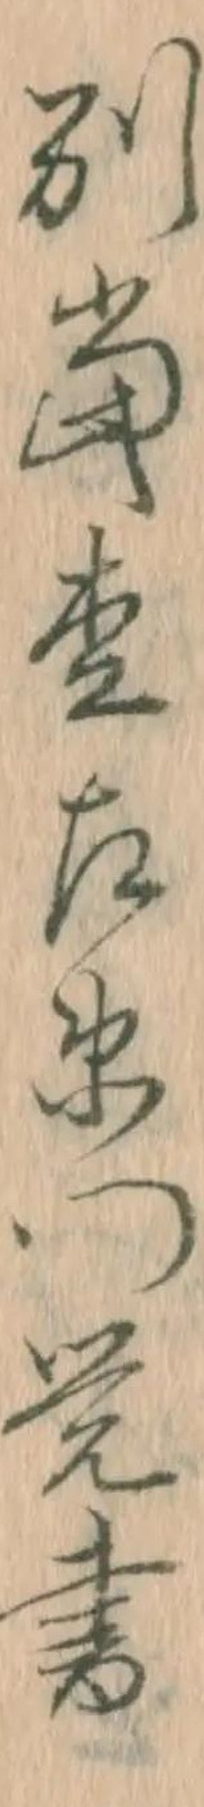別当杢左衛門覚書
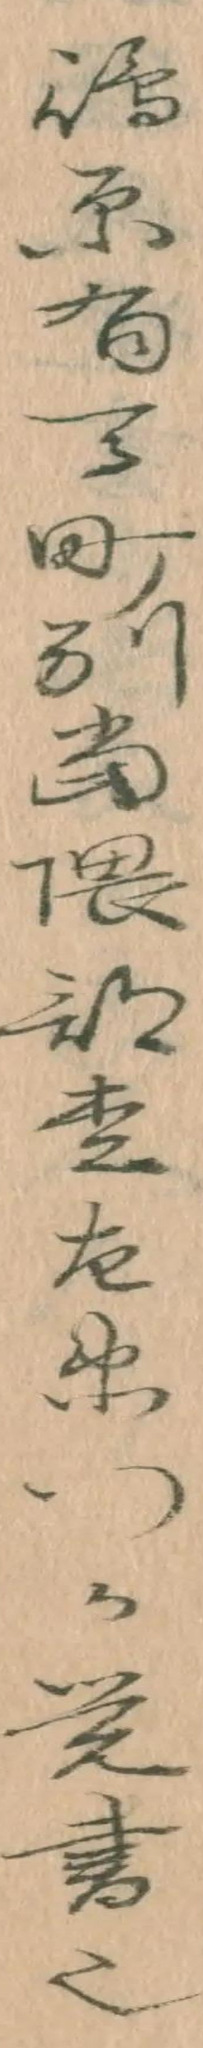島原有馬町別当隈部杢左衛門か覚書也
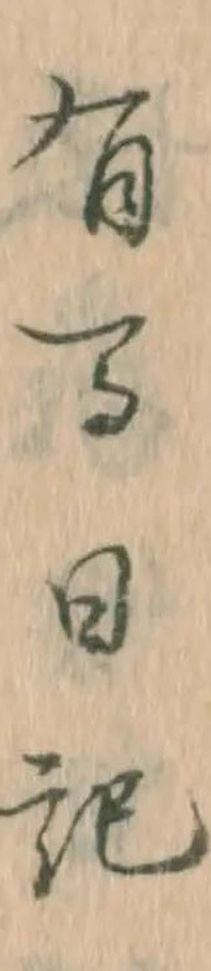有馬日記
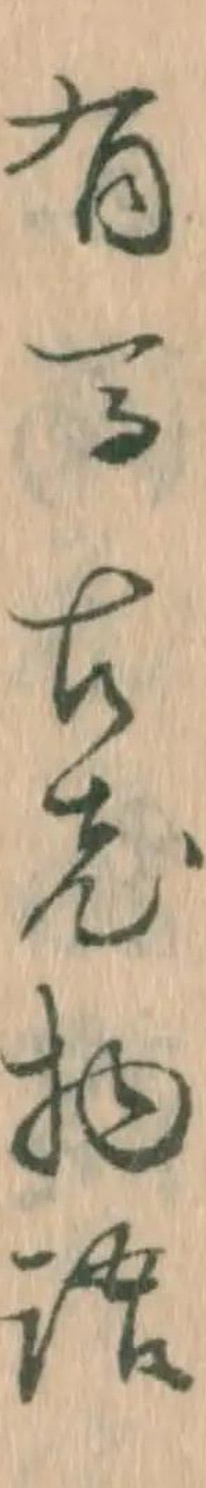有馬古老物語
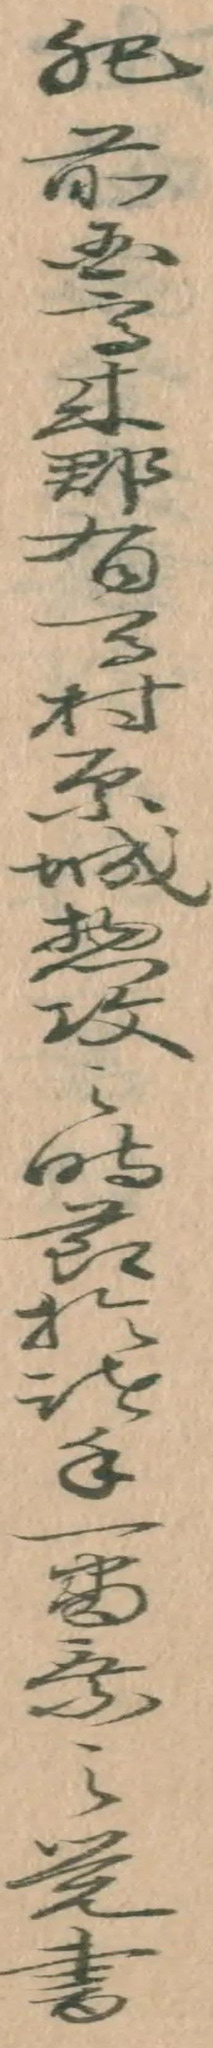肥前国高来郡有馬村原城惣攻之時節於諸手一番乗之覚書
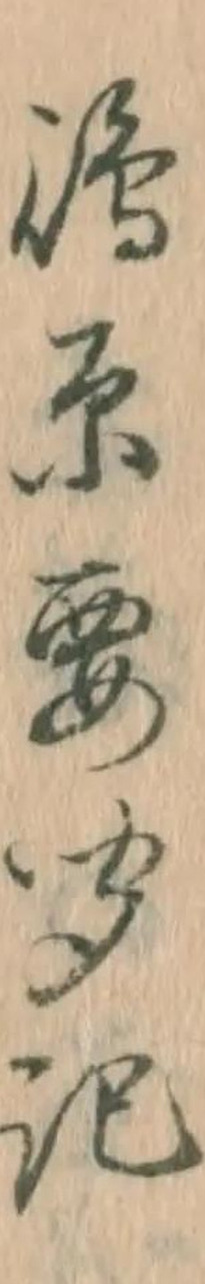島原要聞記
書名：切支丹御退治記 49巻. [1]
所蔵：国立国会図書館 National Diet Library, JAPAN
